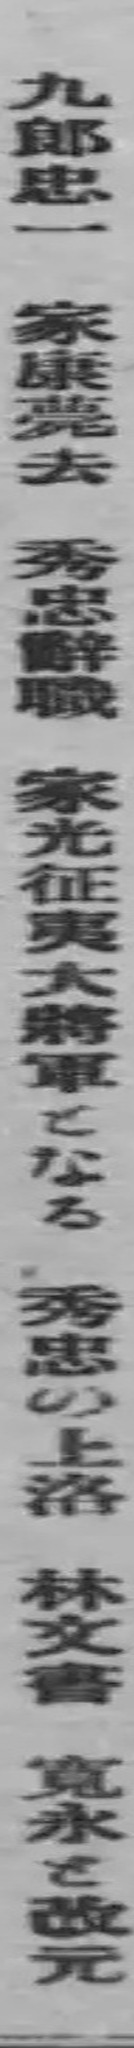九郎忠一家康薨去秀忠辞職家光征夷大将軍となる秀忠の上洛林文書寛永と改元
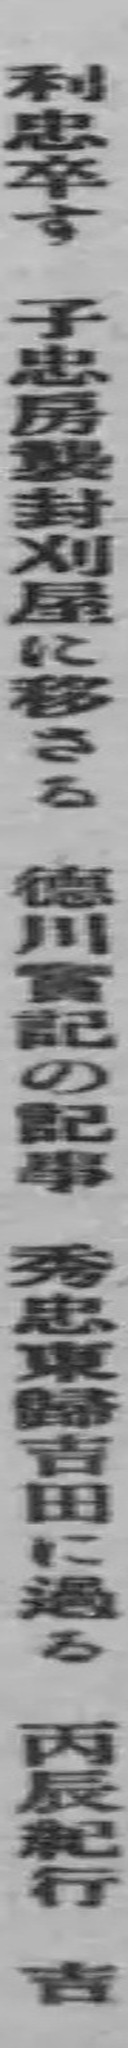利忠卒す子忠房襲封刈屋に移さる徳川実記の記事秀忠東帰吉田に過る丙辰紀行吉
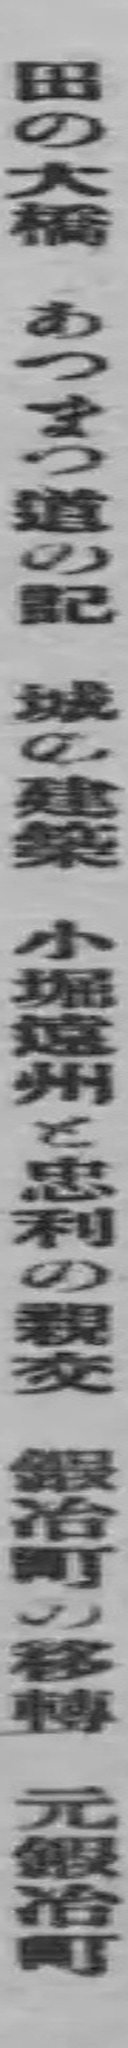田の大橋あつまつ道の記城の建築小堀遠州と忠利の親交鍛冶町の移転元鍛冶町
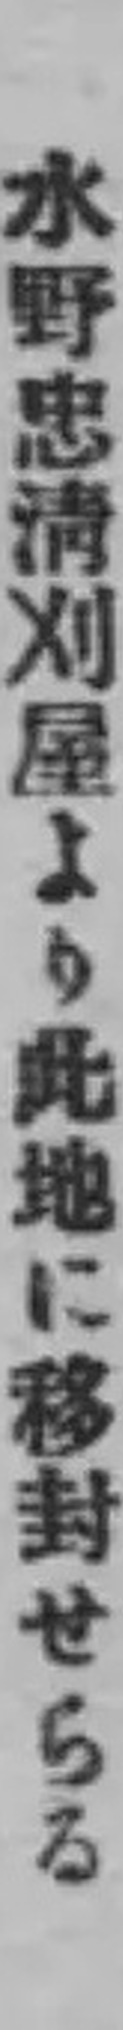水野忠清刈屋より此地に移封せらる
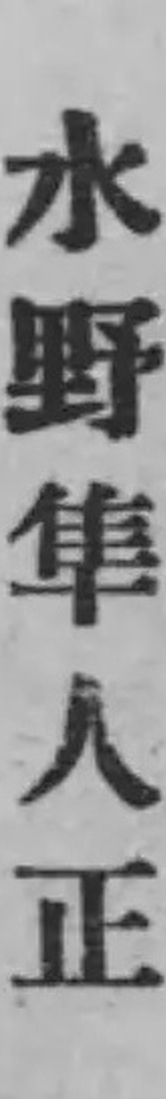水野隼人正
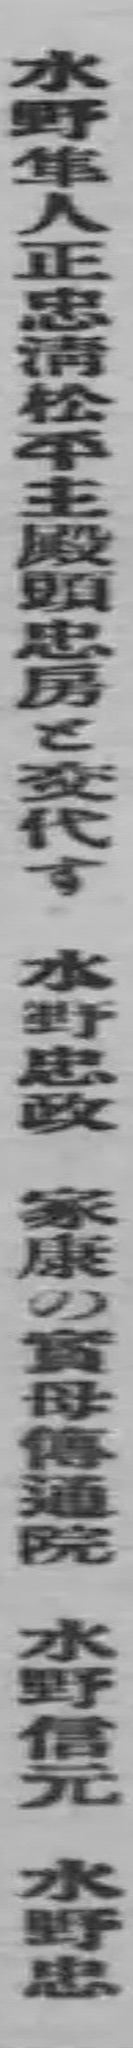水野隼人正忠清松平主殿頭忠房と交代す水野忠政家康の実母伝通院水野信元水野忠
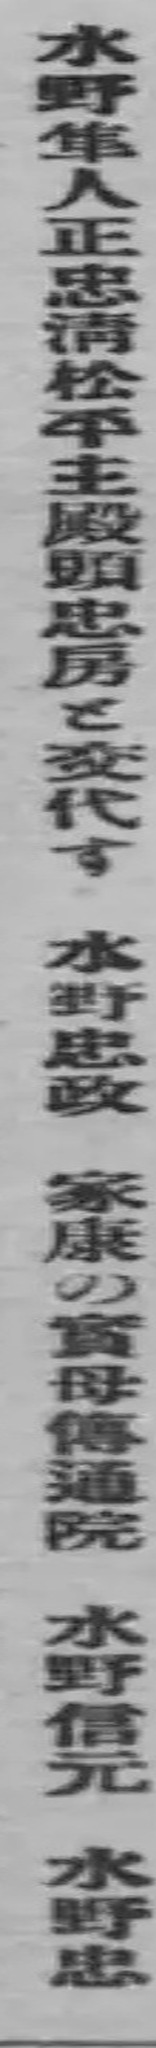水野隼人正忠清松平主殿頭忠房と交代す水野忠政家康の実母伝通院水野信元水野忠
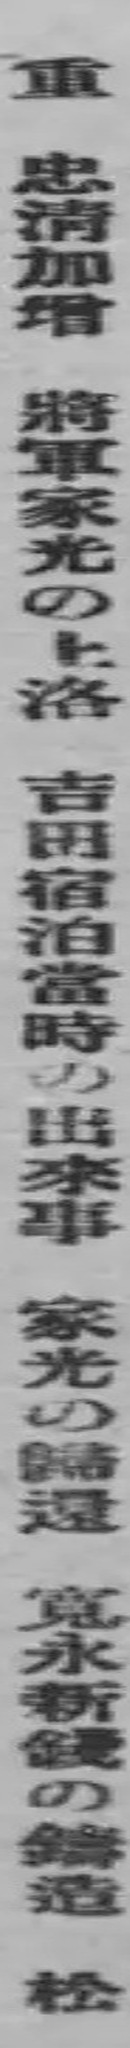重忠清加増将軍家光の上洛吉田宿泊当時の出来事家光の帰還寛永新銭の鋳造松
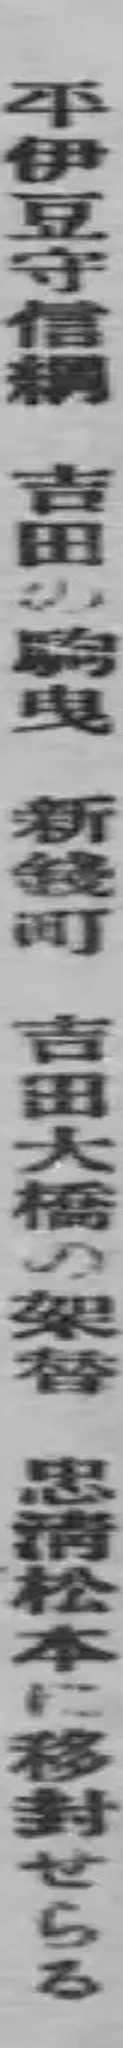平伊豆守信綱吉田の駒曳新銭町吉田大橋の架替忠清松本に移封せらる
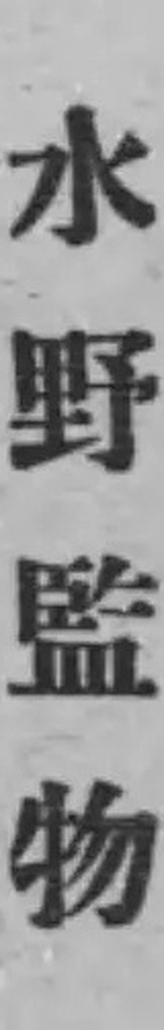水野監物
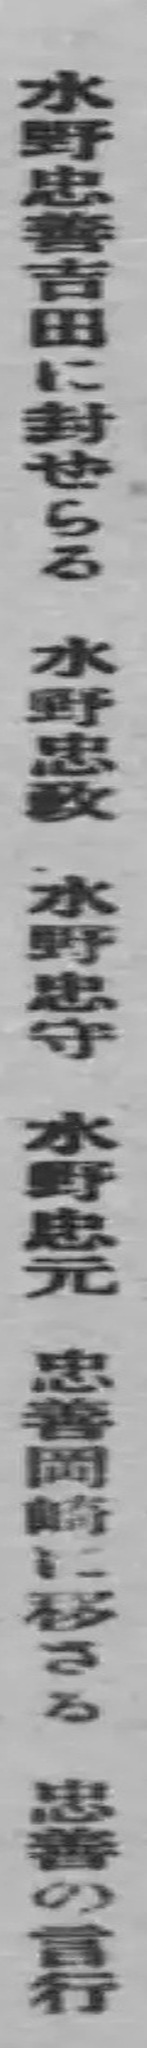水野忠膳善吉田に封ぜらる水野忠政水野忠守水野忠元忠善岡崎に移さる忠善の言行
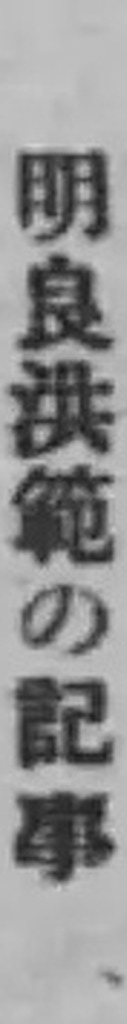明良洪庵の記事
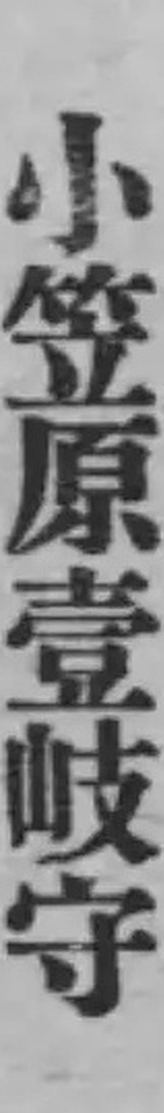小笠原壱岐守
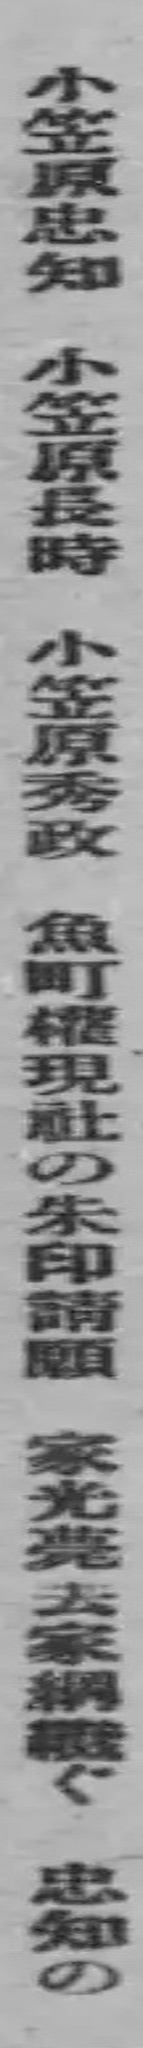小笠原忠知小笠原長時小笠原秀政魚町権現社の朱印請願家光薨去家綱継ぐ忠知の
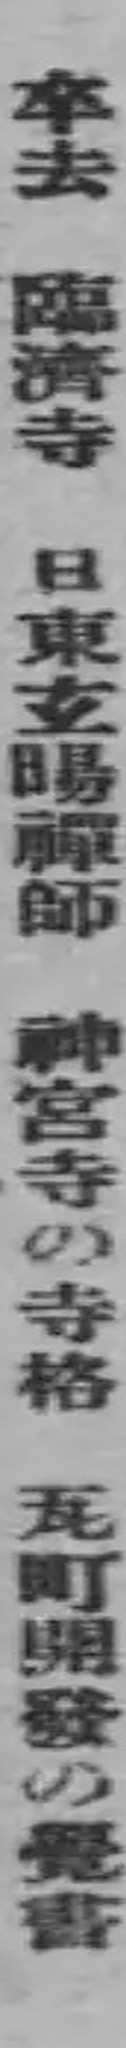卒去臨済寺日東玄暘禅師神宮寺の寺格瓦町開発の覚書

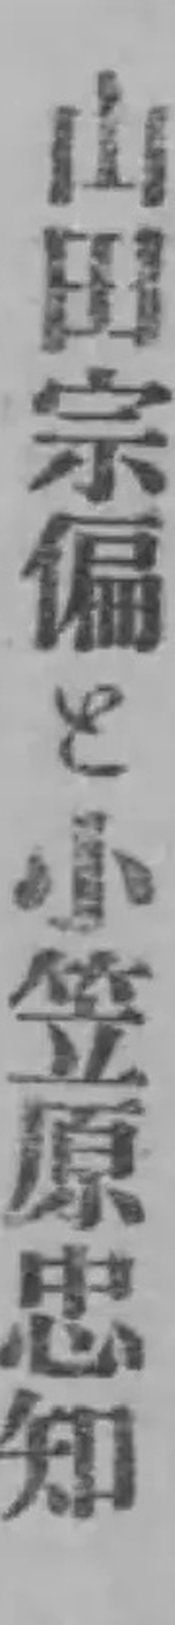山田宗偏と小笠原忠知
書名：豊橋市史談
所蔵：国立国会図書館 National Diet Library, JAPAN
